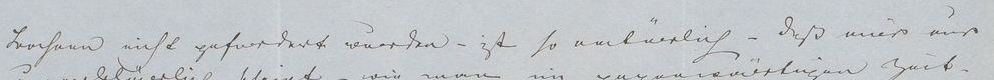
Bahnen nicht gefordert wurden, ist so natürlich, daß uns nur
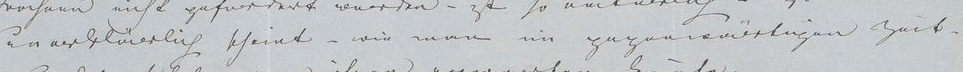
unerklärlich scheint, wie man im gegenwärtigen Zeit-
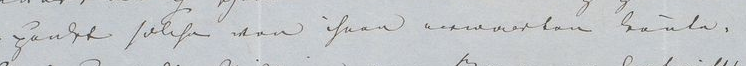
punkt solche von ihnen erwarten konnte.
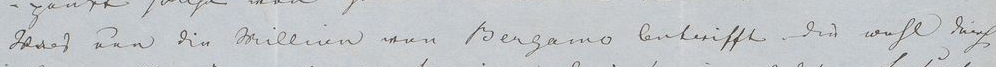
Was nun die Million von Bergamo betrifft, die wohl durch
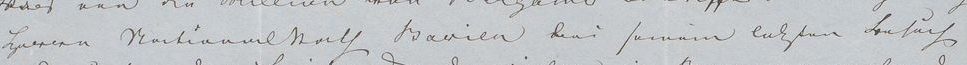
Herrn Nationalrath Bavier bei seinem letzten Besuch
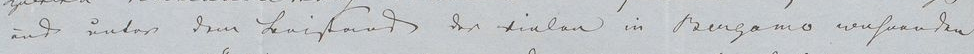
und unter dem Beistand der vielen in Bergamo wohnenden
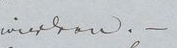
wirken. –
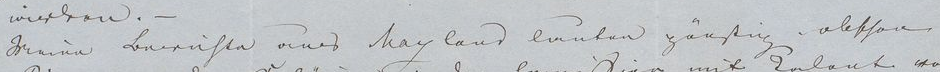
Meine Berichte aus Mayland lauten günstig, obschon
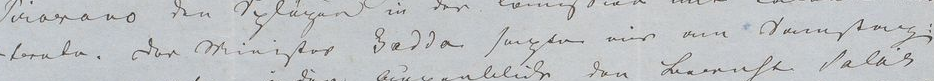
trete. Der Minister Gadda sagte mir am Samstag:
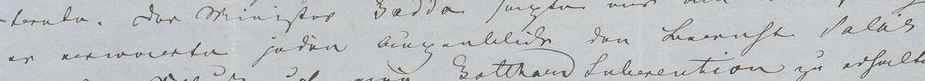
er erwarte jeden Augenblick den Bericht Salas
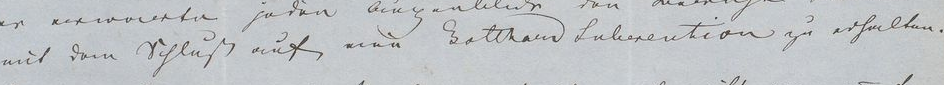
mit dem Schluß auf eine Gotthard Subvention zu erhalten.
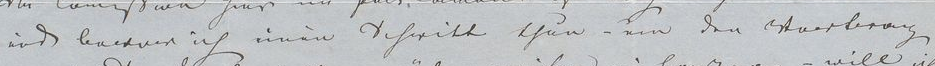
und bevor ich einen Schritt thue, um den Vertrag
